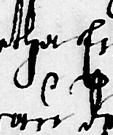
11.
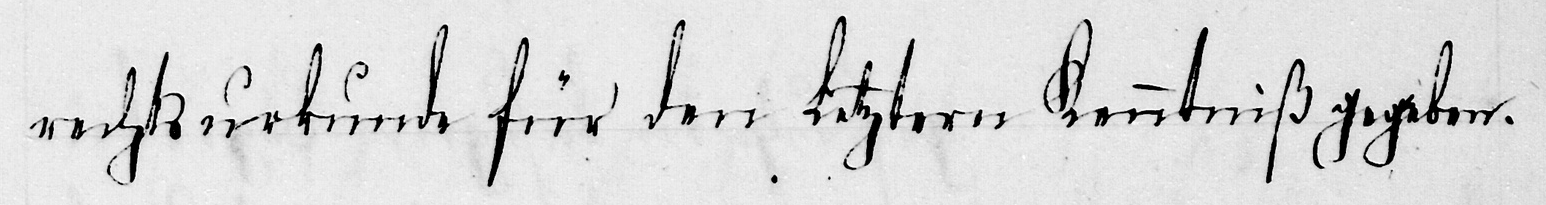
rechtsurkunde für den Letztern Kenntniß gegeben.
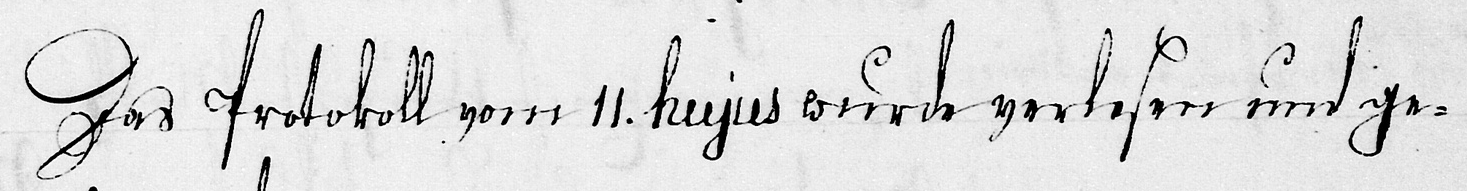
Das Protokoll vom 11. hujus wurde verlesen und ge¬
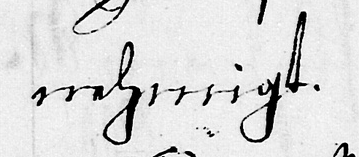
nehmigt.
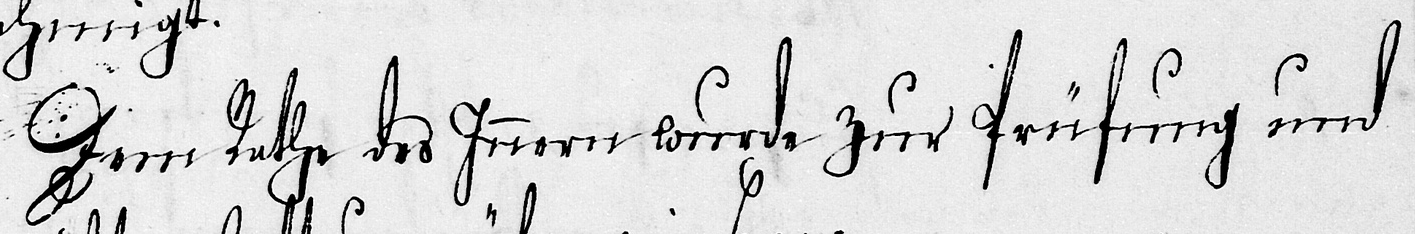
Dem Rathe des Innern wurde zur Prüfung und
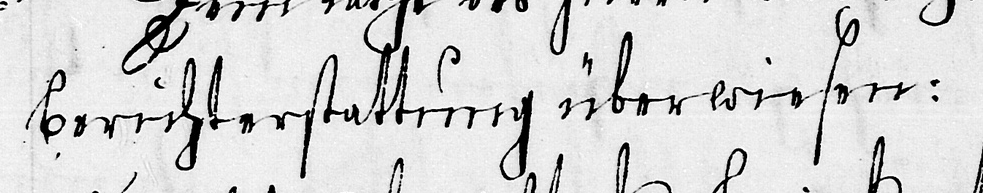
Berichterstattung überwiesen:
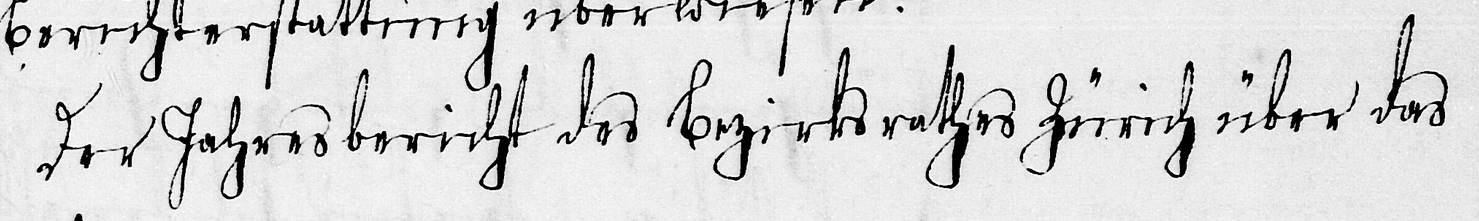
Der Jahresbericht des Bezirksrathes Zürich über das
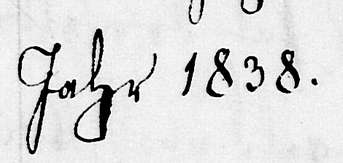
Jahr 1838.
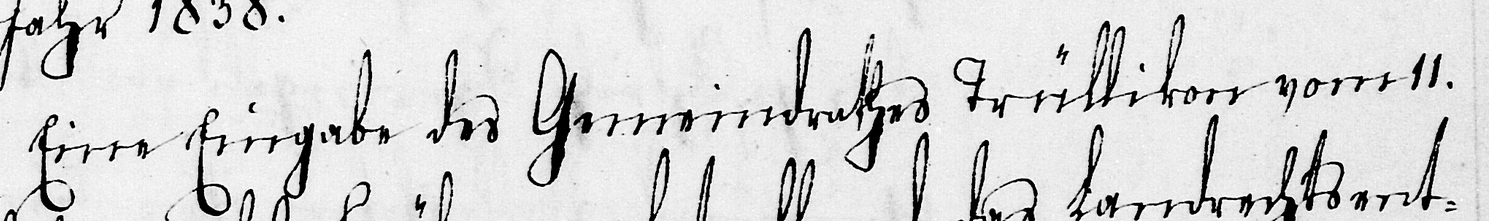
Eine Eingabe des Gemeindrathes Trüllikon vom 11.
